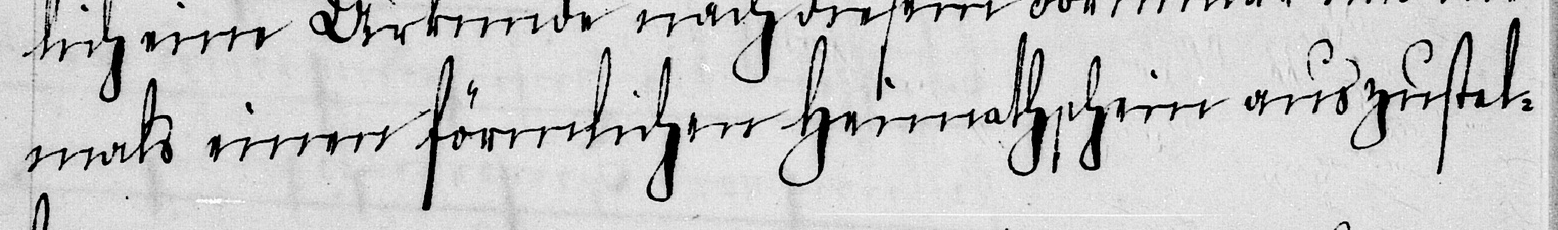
mals einen förmlichen Heimathschein auszustel¬
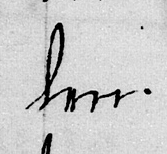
len.
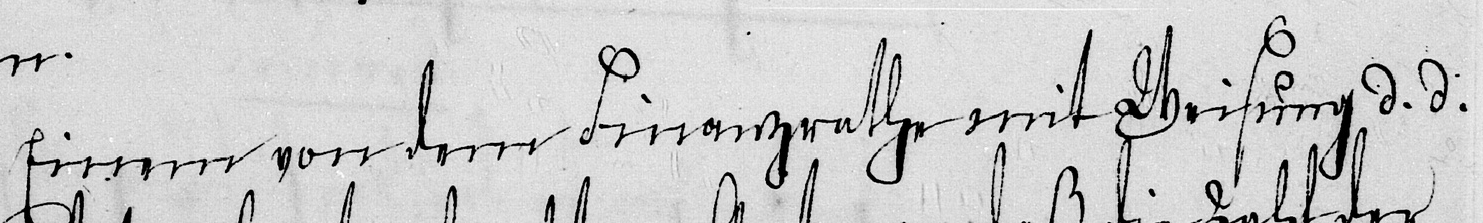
Einem von dem Finanzrathe mit Weisung d. d.
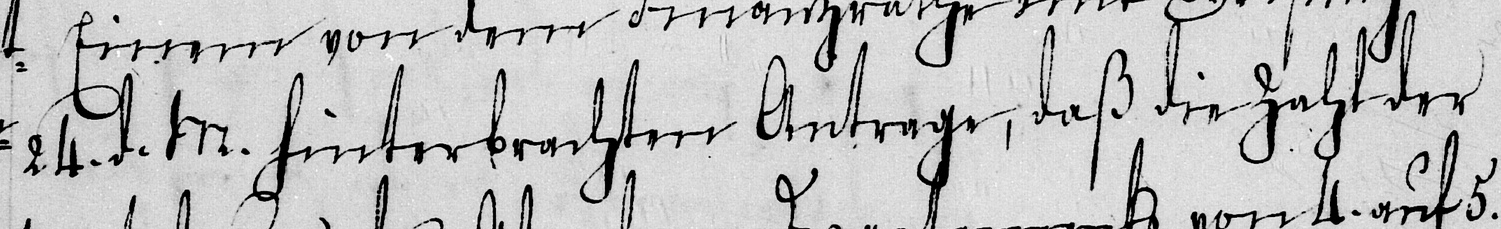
24. d. M. hinterbrachten Antrage, daß die Zahl der
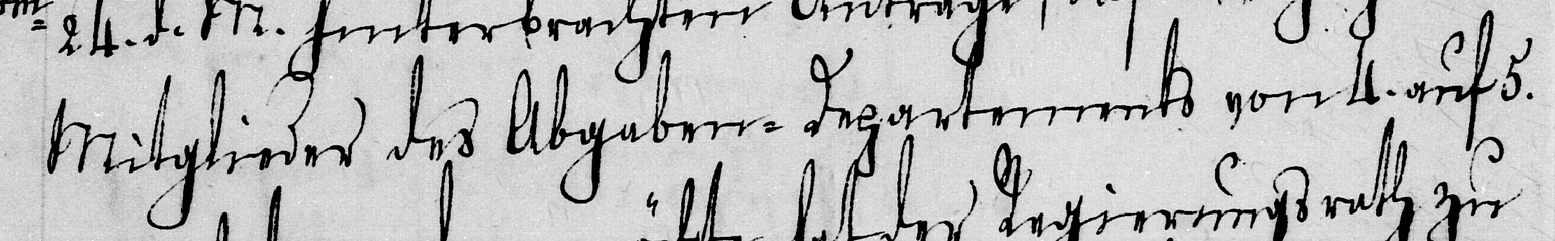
Mitglieder des Abgaben-Departements von 4. auf 5.
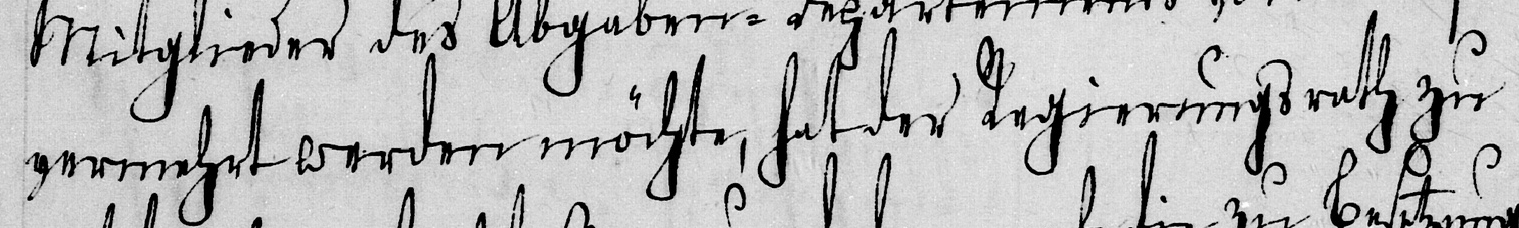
vermehrt werden möchte, hat der Regierungsrath zu
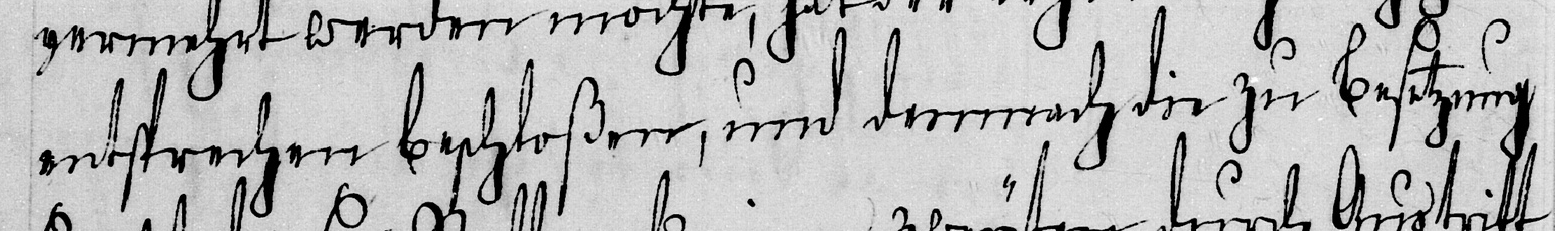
entsprechen beschloßen, und demnach die zu Besetzung
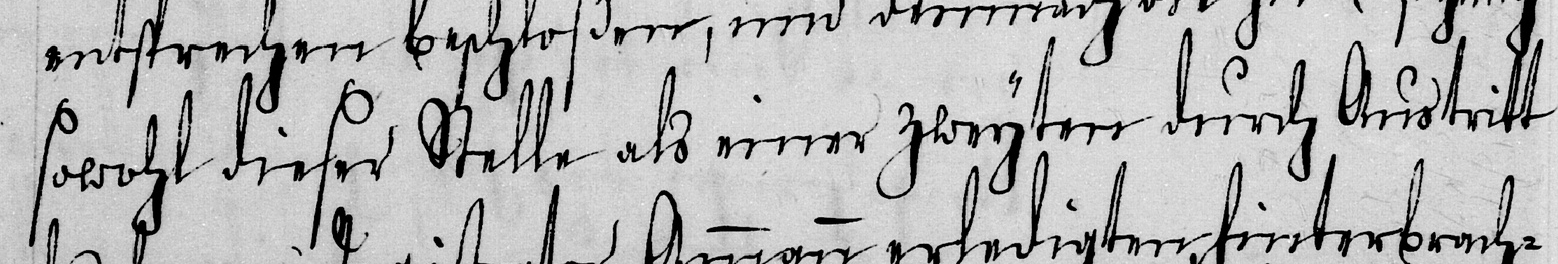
sowohl dieser Stelle als einer zweyten durch Austritt
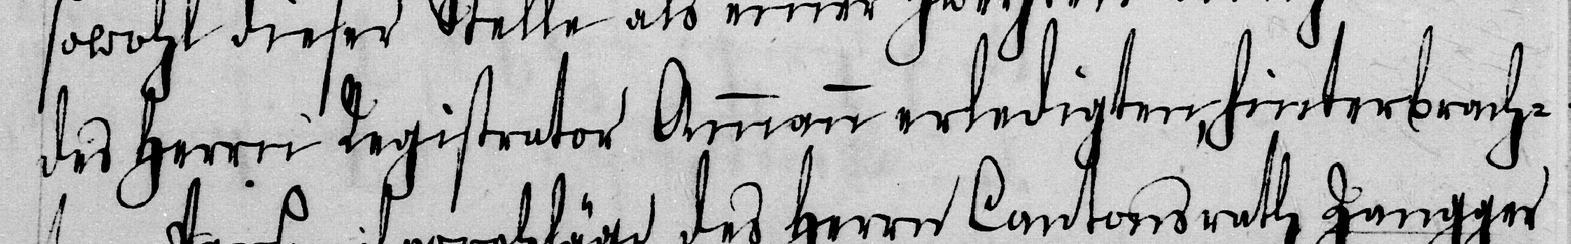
des Herrn Registrator Ammann erledigten, hinterbrach¬
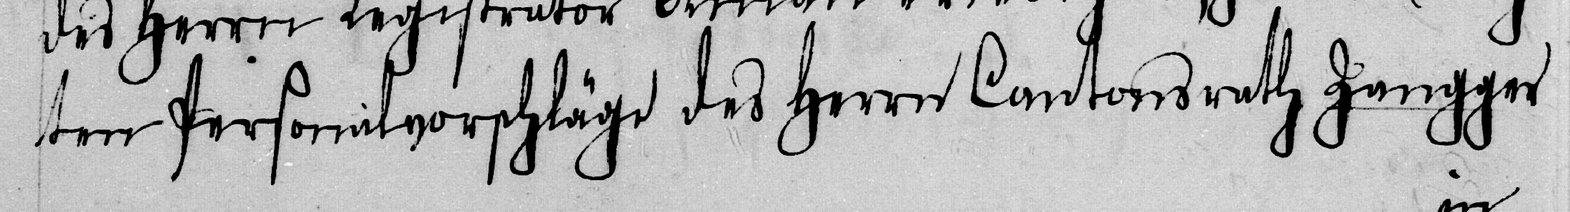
ten Personalvorschläge des Herrn Cantonsrath Zangger
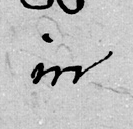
in
